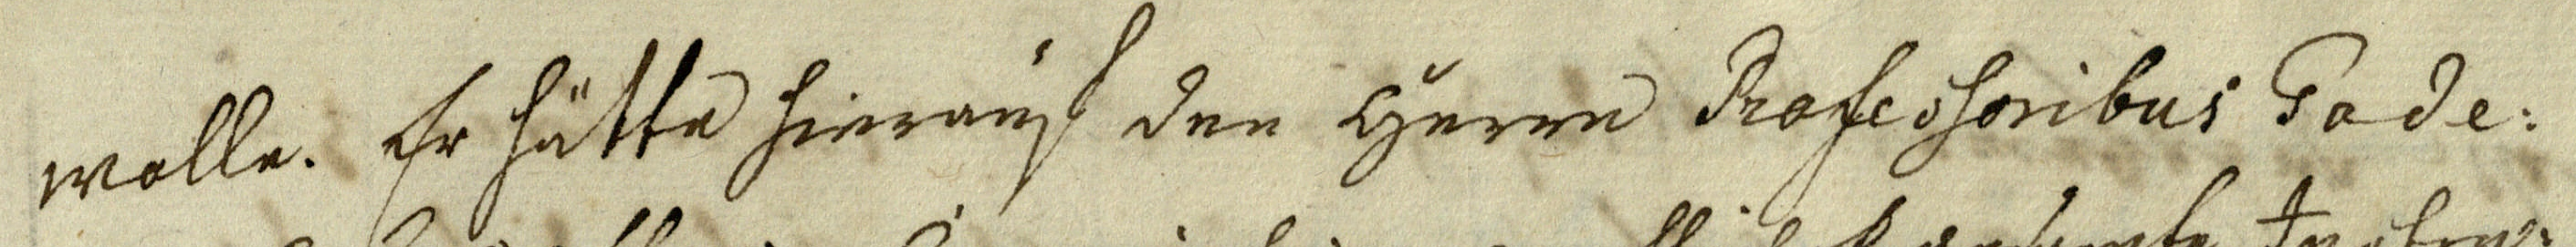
wolle. Er hätte hierauf den Herrn Professoribus Gade¬
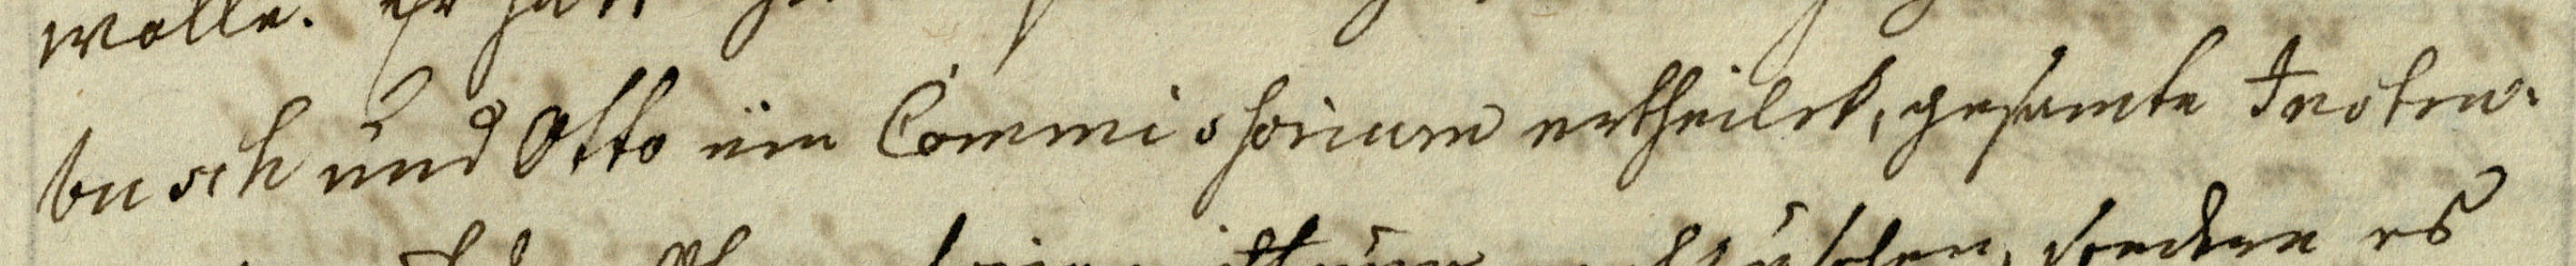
busch und Otto ein Commissorium ertheilet, gesamte Instru¬
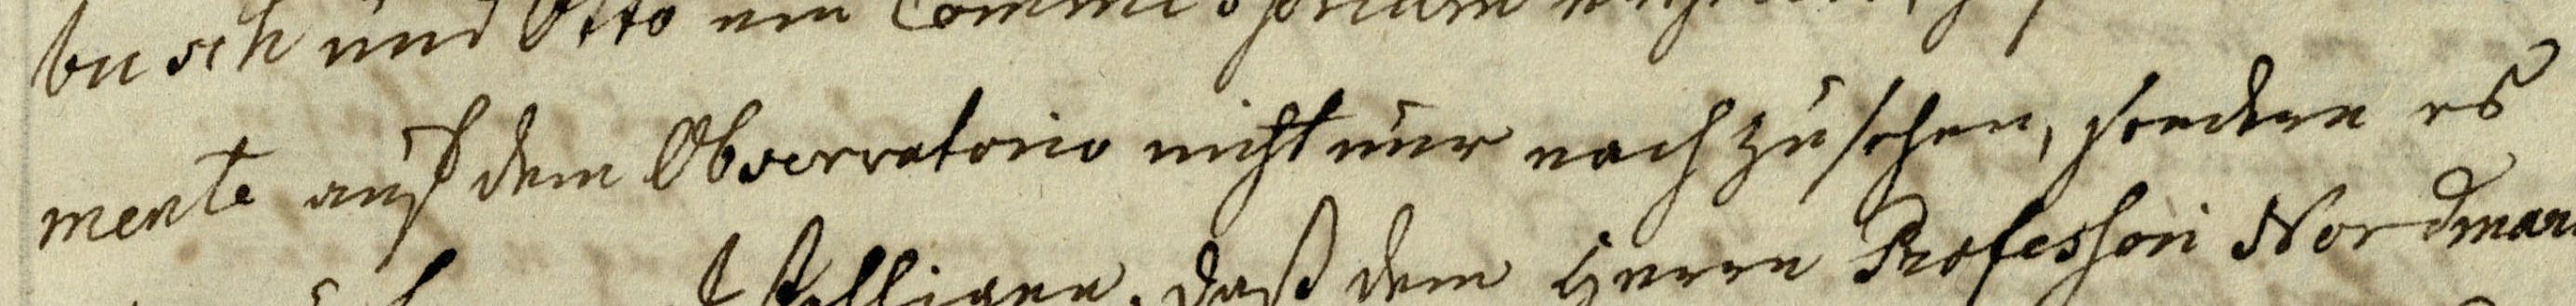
mente auf dem Observatorio nicht nur nachzusehen, sondern es
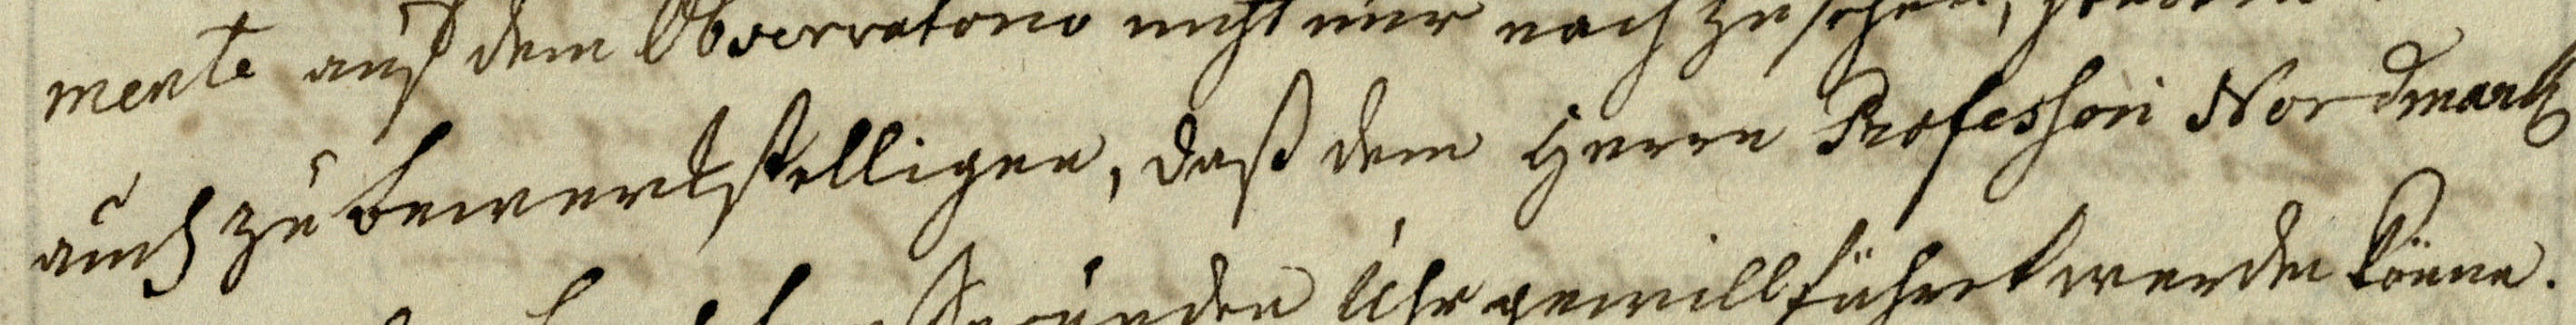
auch zu bewerckstelligen, daß dem Herrn Professori Nordmark
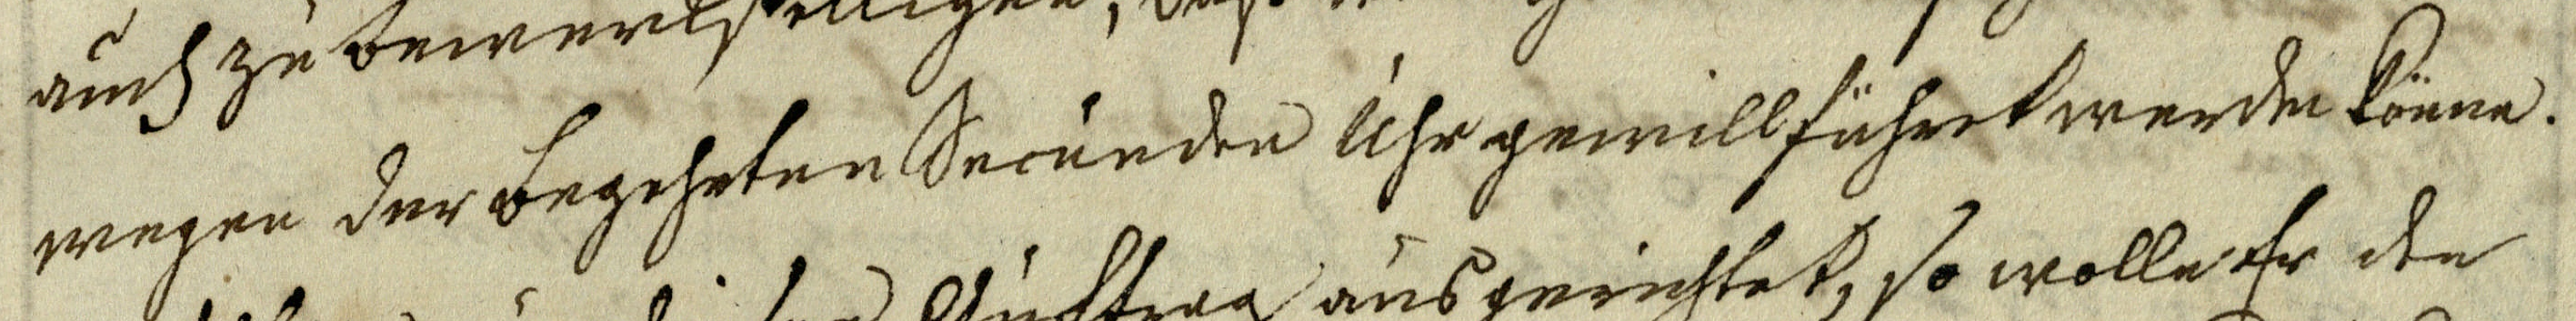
wegen der begehrten Secunden Uhr gewillfähret werden könne.
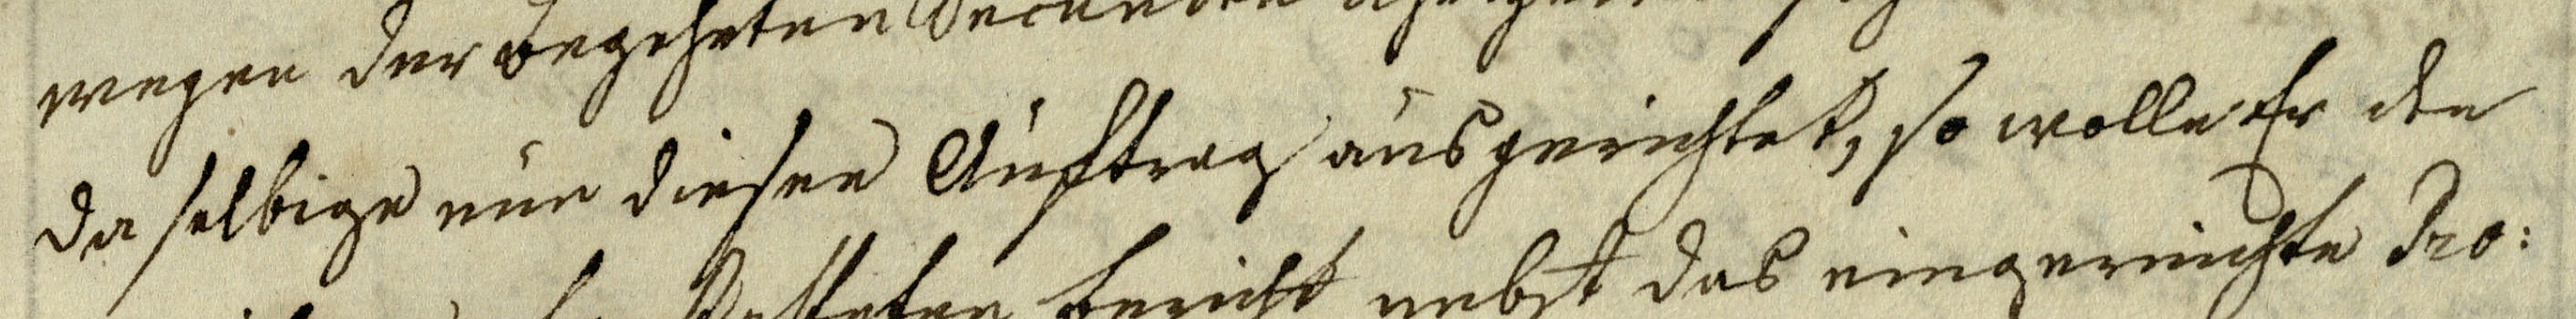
Da selbige nun diesen Auftrag ausgerichtet, so wolle Er den
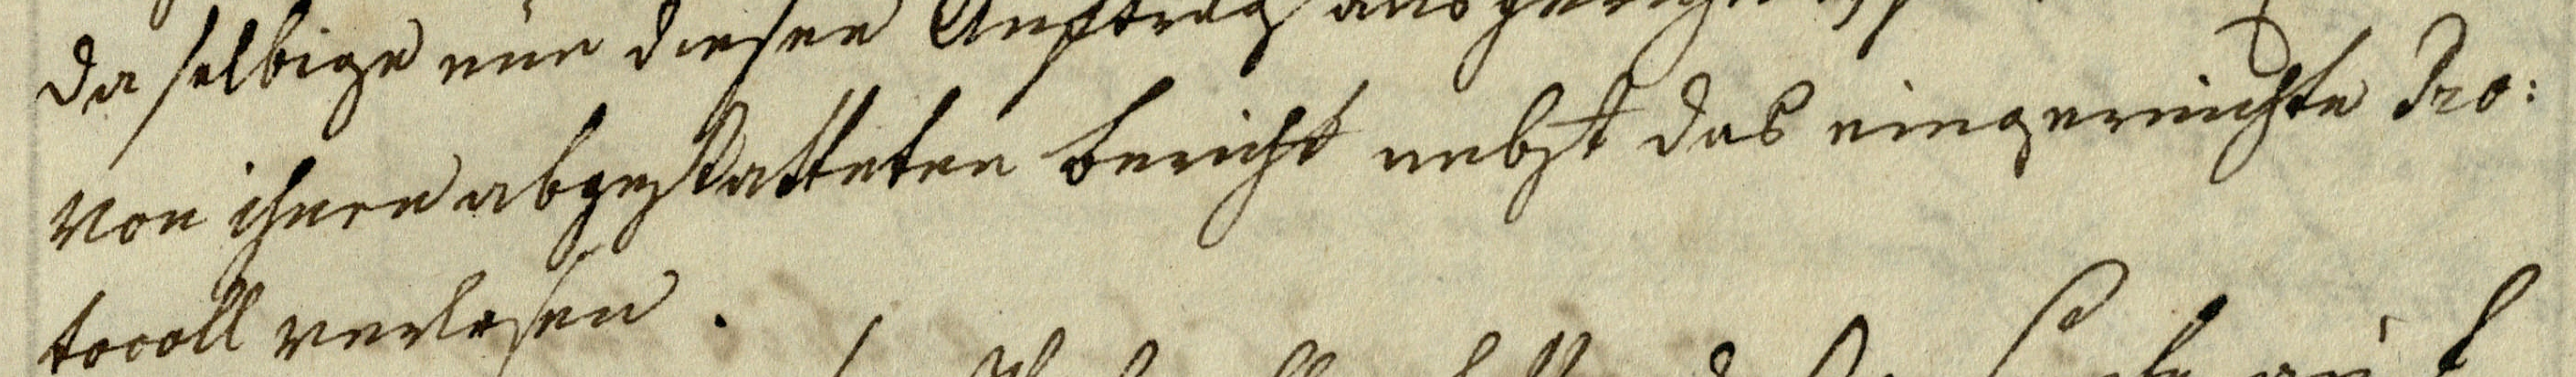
von Ihnen abgestatteten Bericht nebst das eingereichte Pro¬
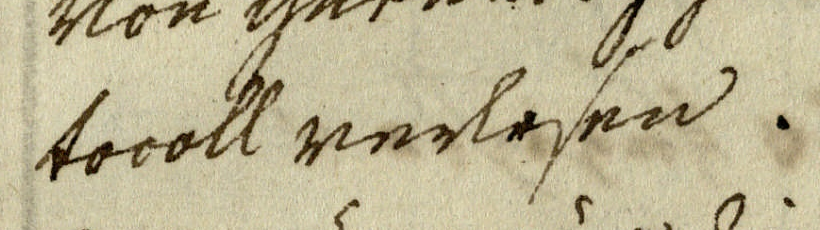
tocoll verlesen.
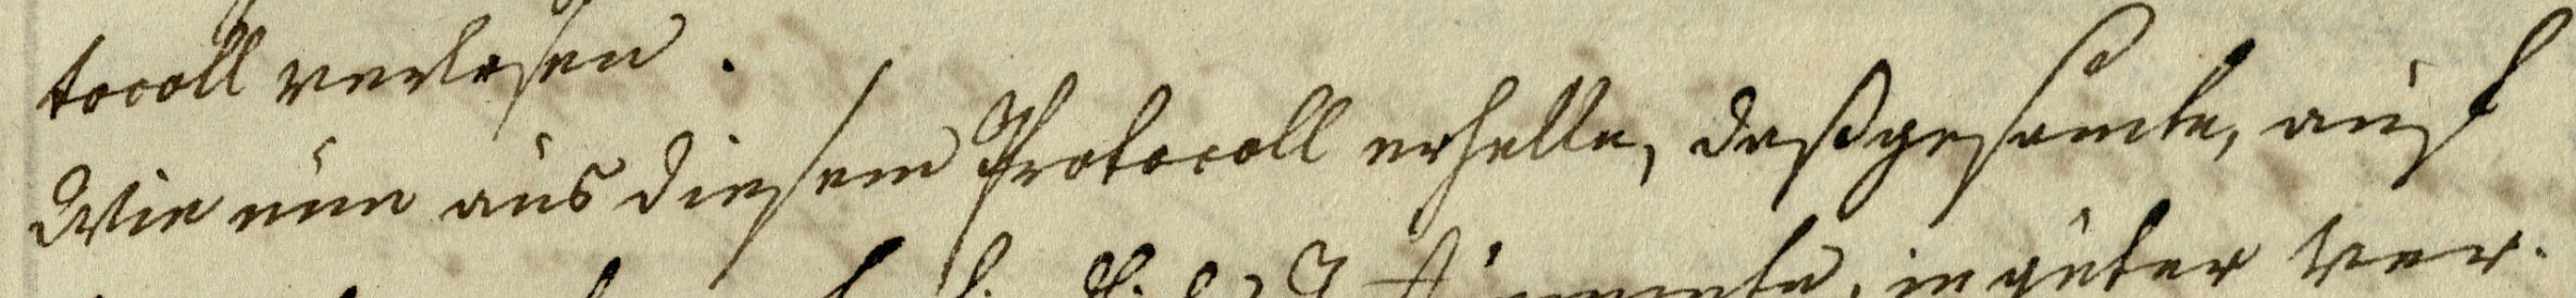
Wie nun aus diesem Protocoll erhelle, daß gesamte, auf
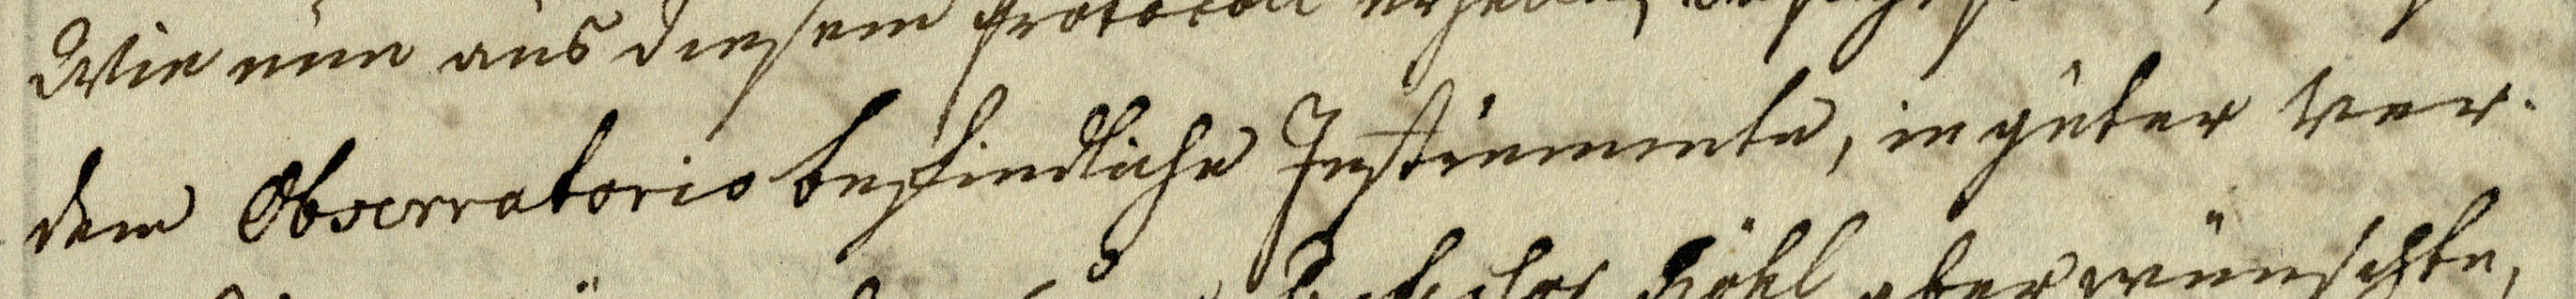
dem Observatorio befindliche Instrumente, in guter Ver¬
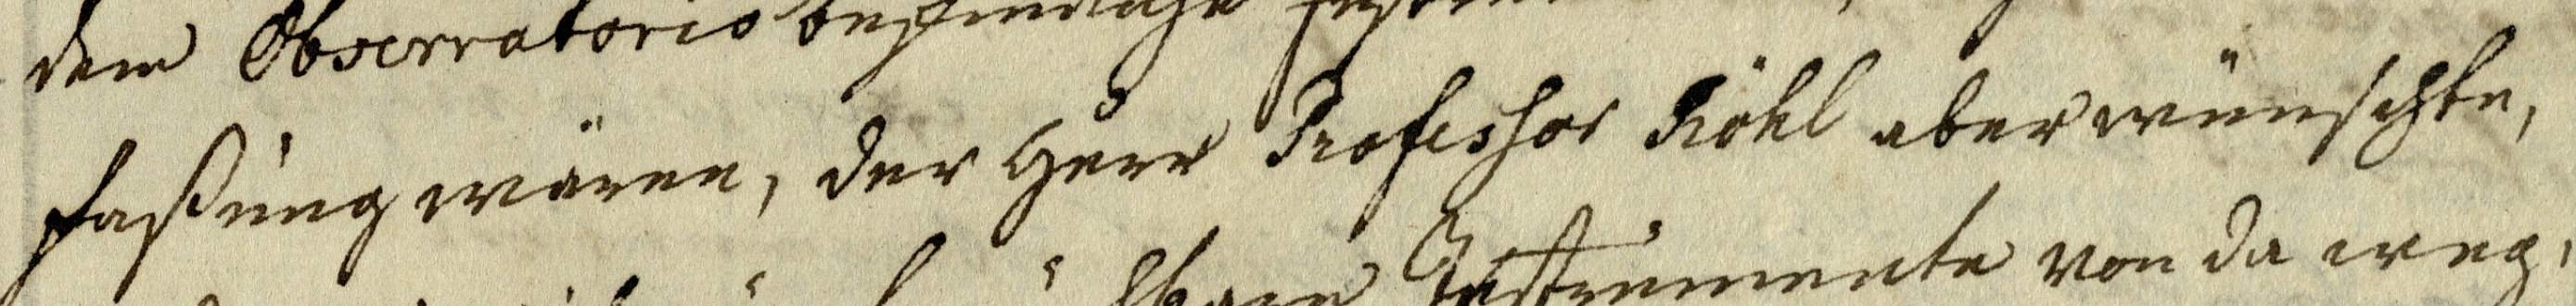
faßung wären, der Herr Professor Röhl aber wünschte,
